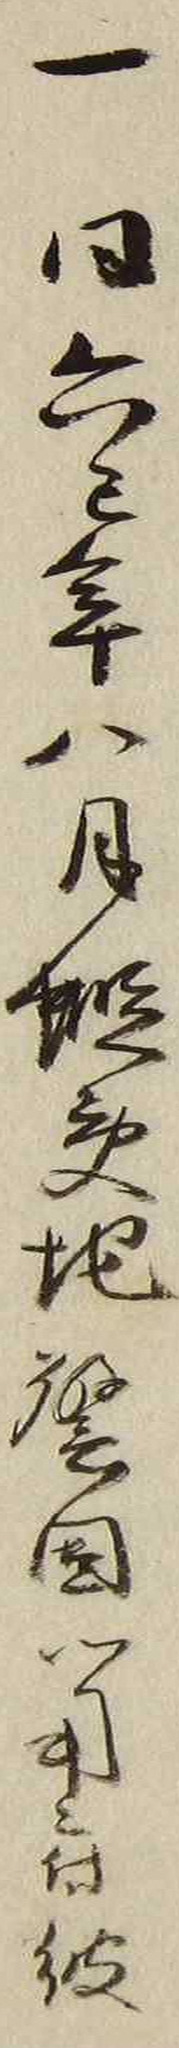一同六己年八月蝦夷地警固御用に付彼

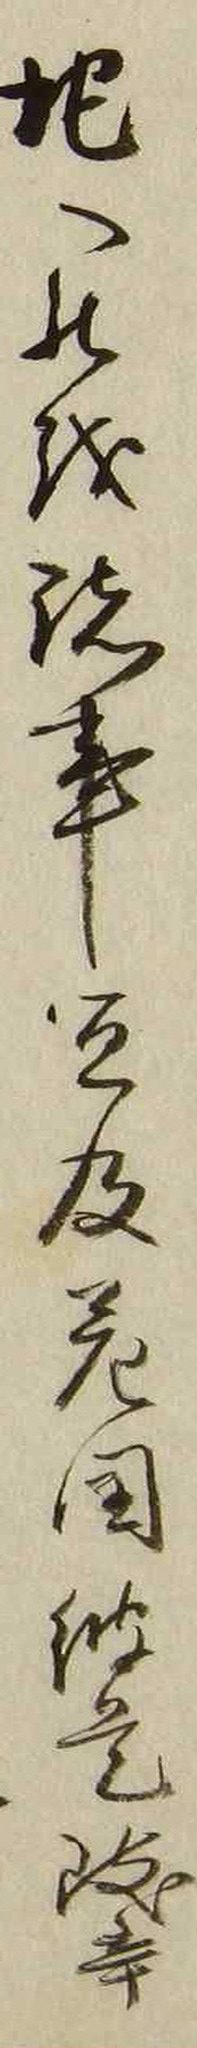地へ罷越諸事宜及差図彼是致辛
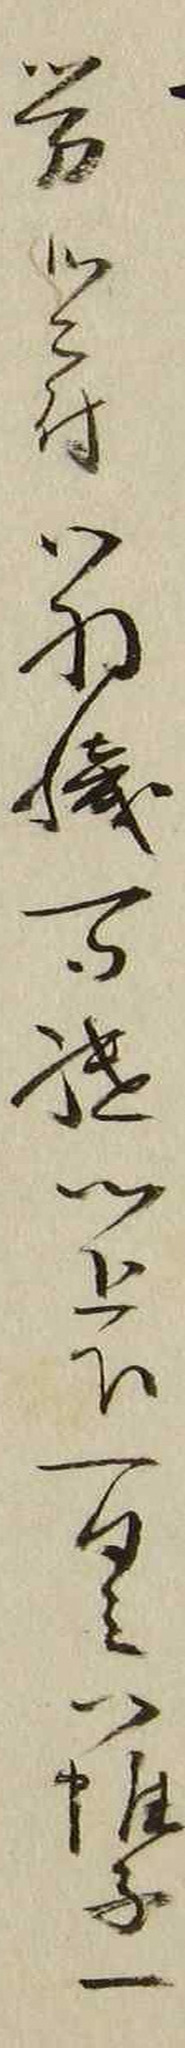労候に付御羽織一つ継御上下一具御帷子一
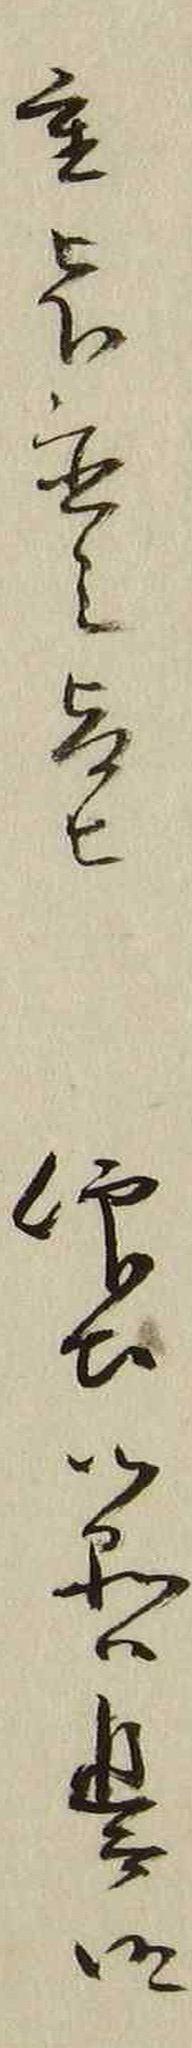重被下置之旨被仰出御品は追而御
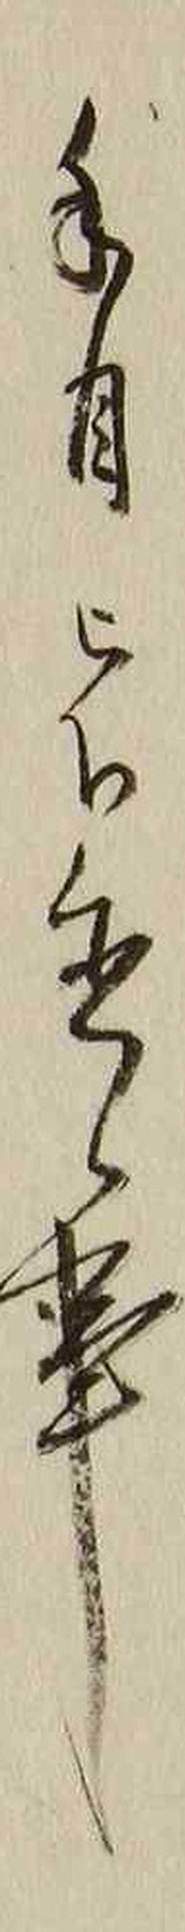手自被下置候事
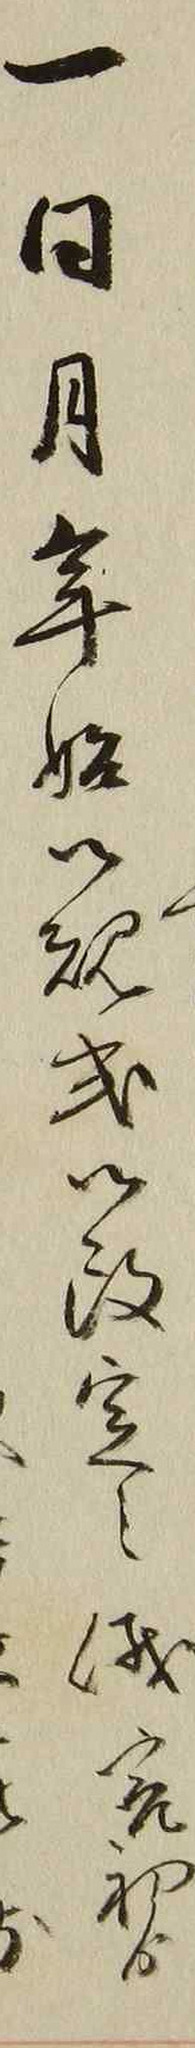一同月年始御規式御改定之儀最初ゟ
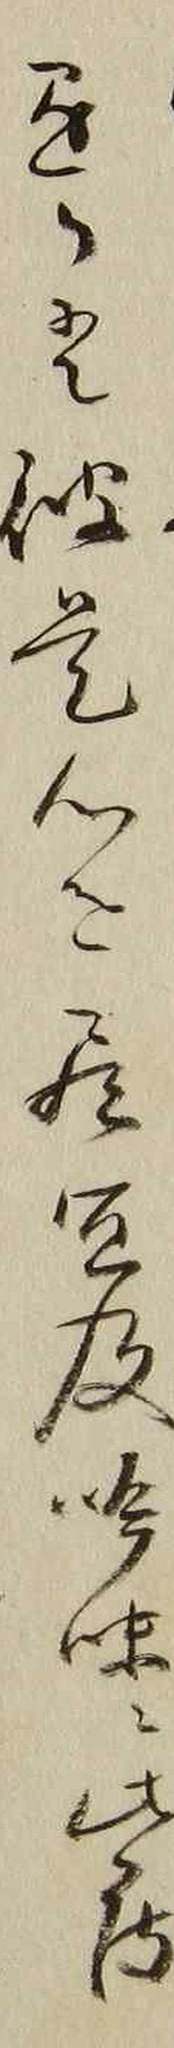懸りにて彼是心を尽宜及吟味候此度
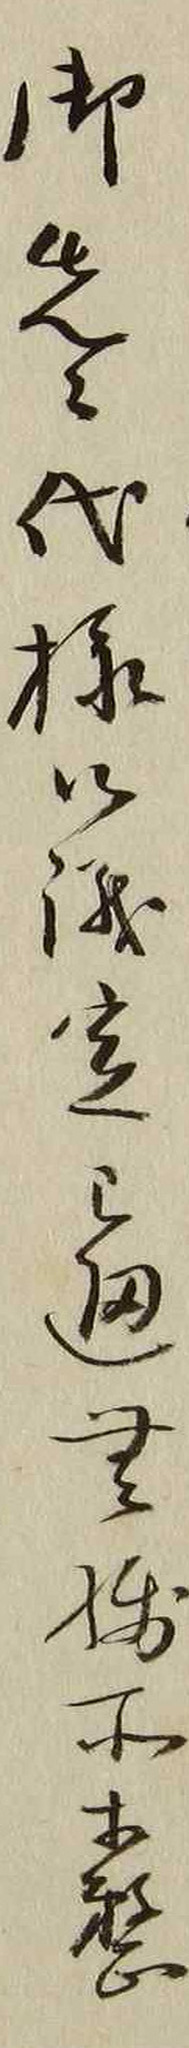御先々代様御議定之通無勝所相整
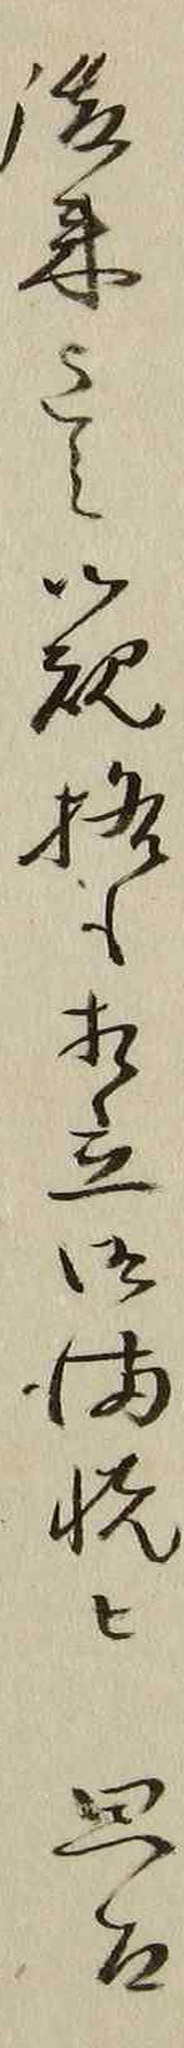後來迄之御規格も相立御満悦被思召
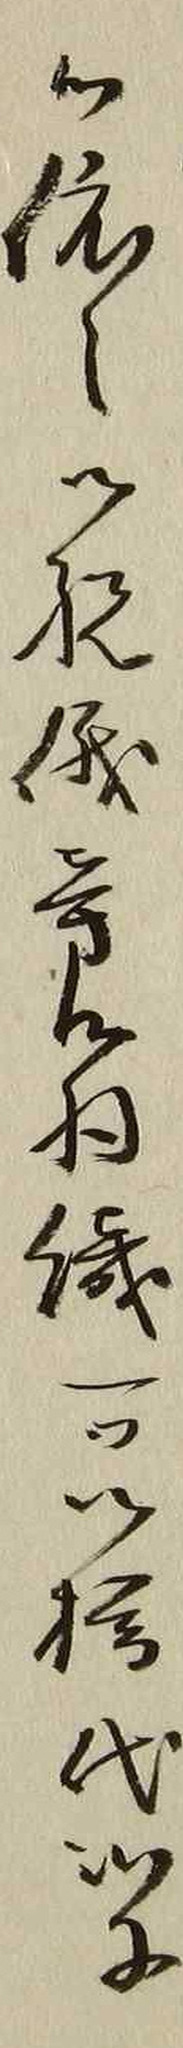候依之御祝儀旁御羽織一つ御樽代弐千
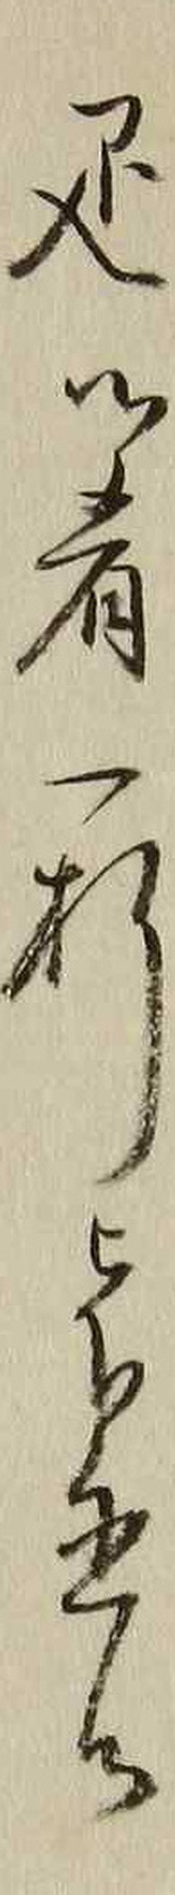疋御肴一折被下置候
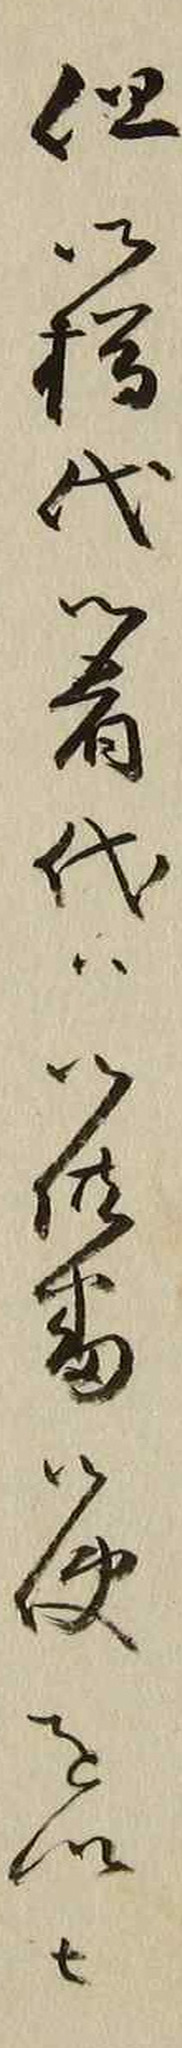但御樽代御肴代は御供番御使を以被
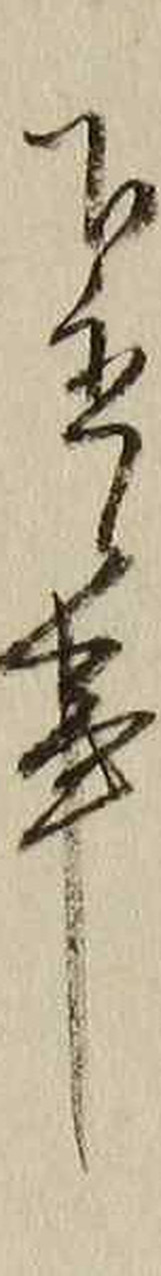下置候事
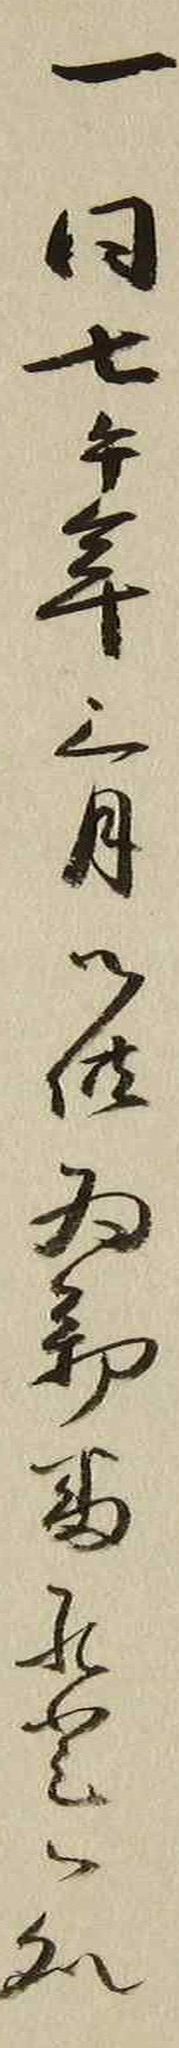一同七午年三月御供為勤番罷登候処
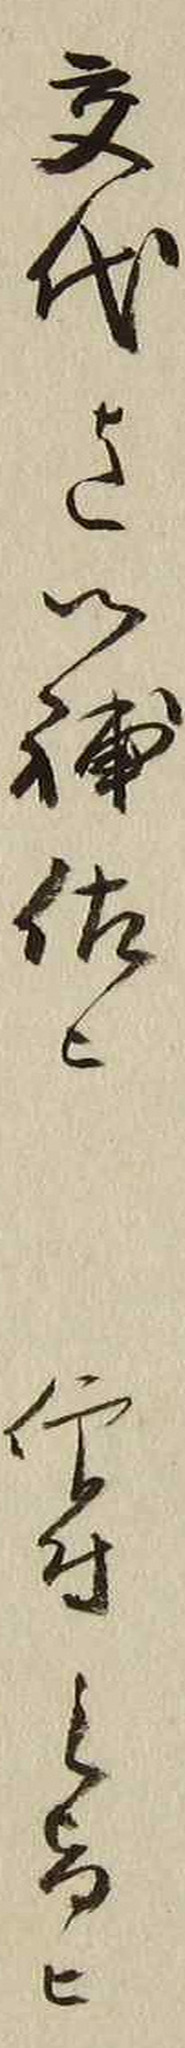交代迄御補佐被仰付之旨被
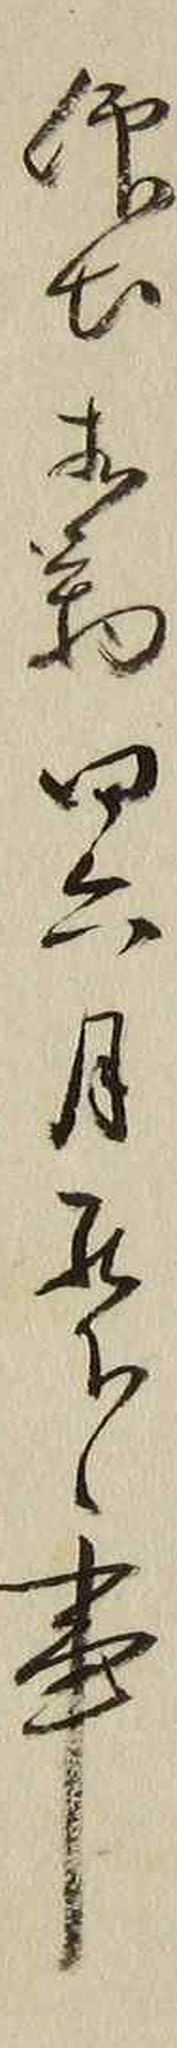仰出相勤同六月罷下候事
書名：諸士系譜　巻之292　き之部1
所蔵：会津若松市立会津図書館
